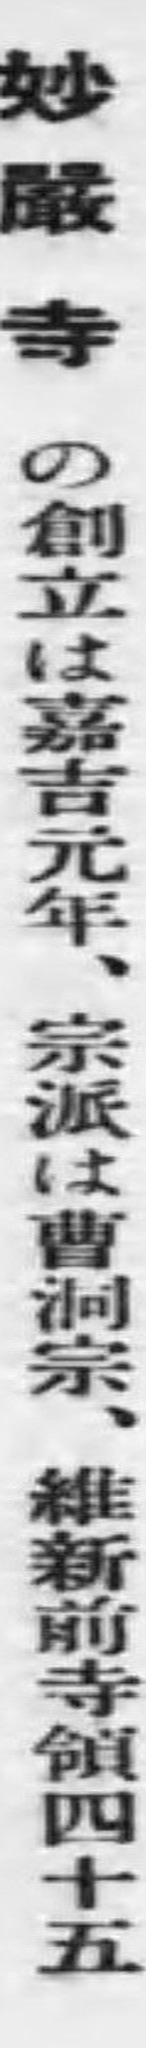妙嚴寺の創立は嘉吉元年、宗派は曹洞宗、維新前寺領四十五
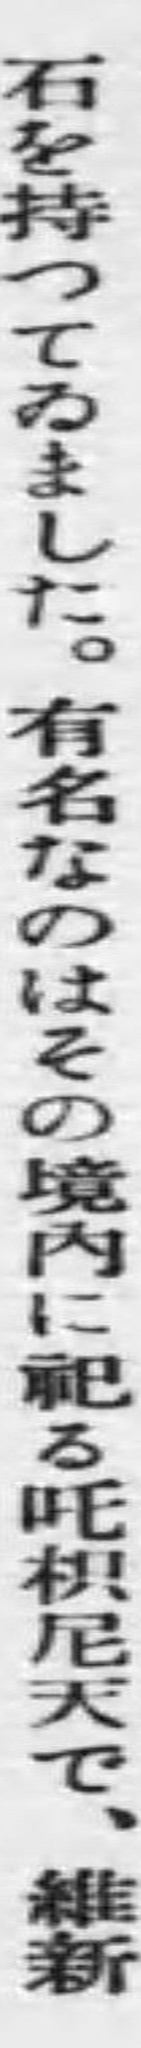石を持つてゐました。有名なのはその境内に祀る吒枳尼天で、維新
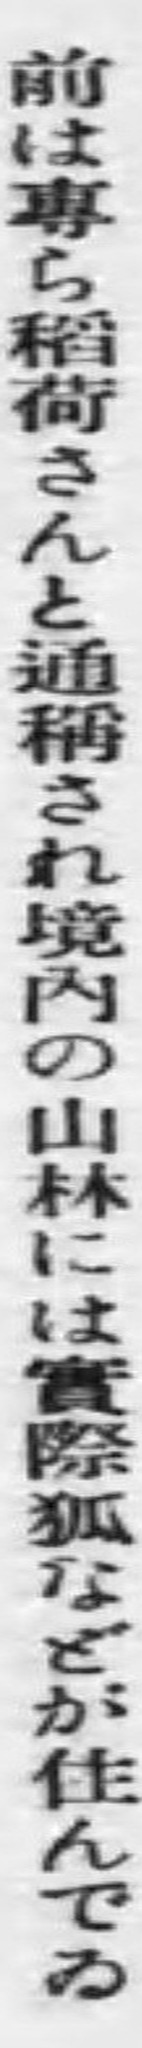前は專ら稻荷さんと通稱され境内の山林には實際狐などが住んでゐ
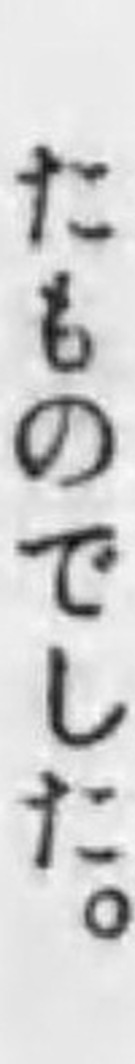たものでした。
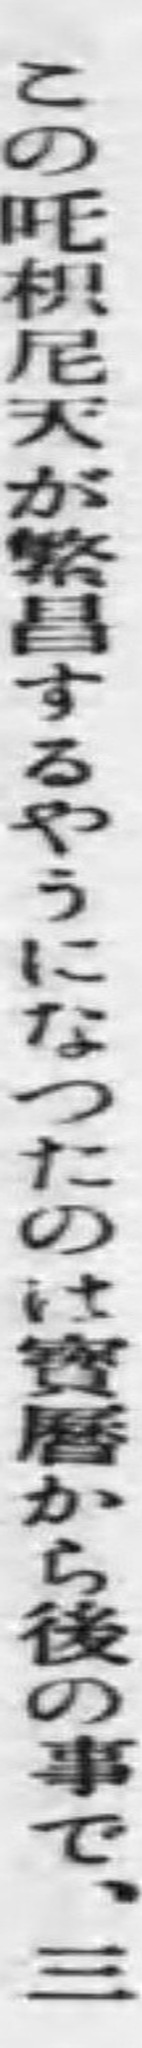この吒枳尼天が繁昌するやうになつたのは寶暦から後の事で、三
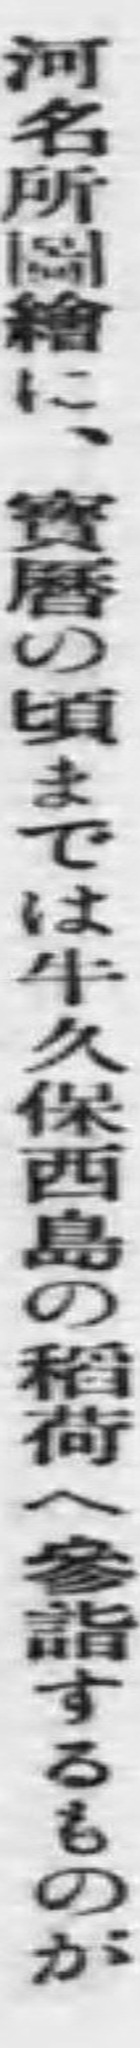河名所圖繪に、寶暦の頃までは牛久保西島の稻荷へ參詣するものが
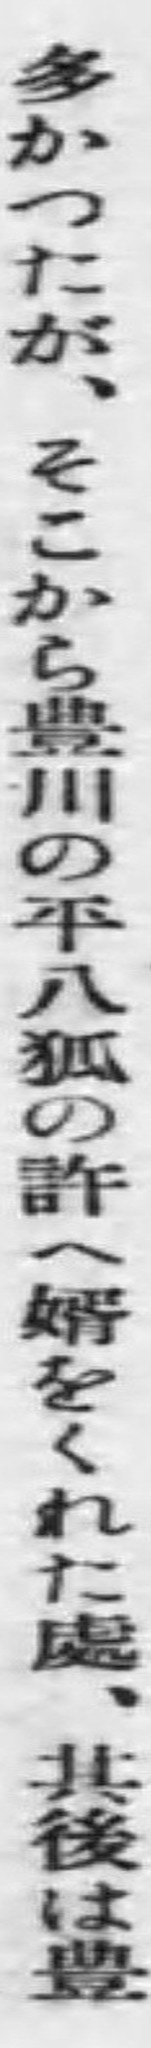多かつたが、そこから豊川の平八狐の許へ婿をくれた處、其後は豊
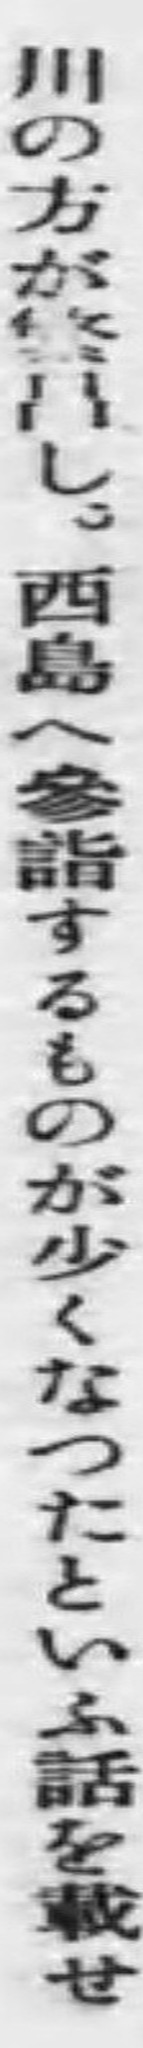川の方が繁昌し。西島へ參詣するものが少くなつたといふ話を載せ
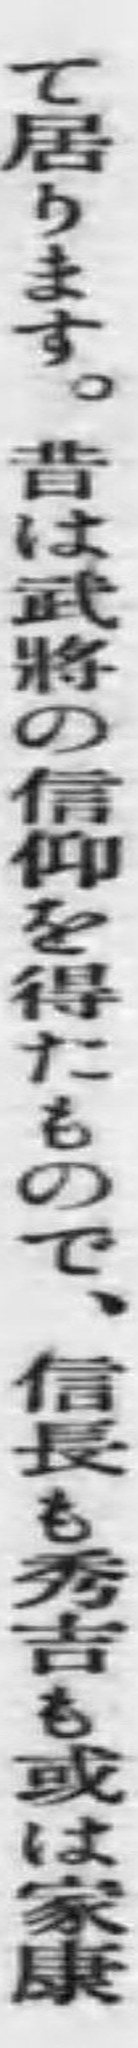て居ります。昔は武將の信仰を得たもので、信長も秀吉も或は家康
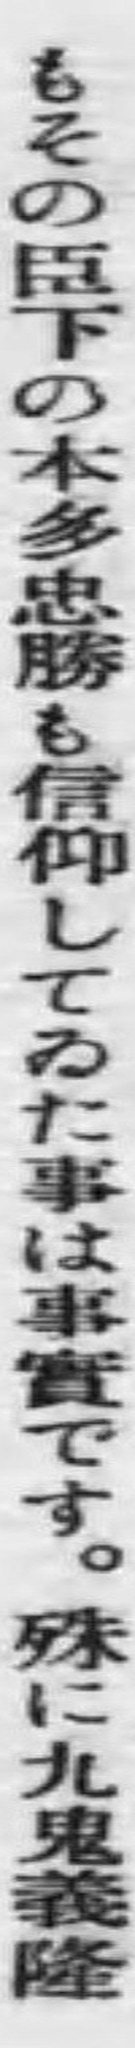もその臣下の本多忠勝も信仰してゐた事は事實です。殊に九鬼義隆
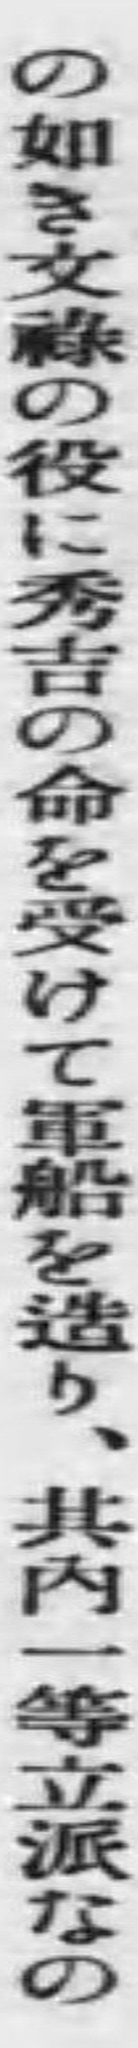の如き文祿の役に秀吉の命を受けて軍船を造り、其内一等立派なの
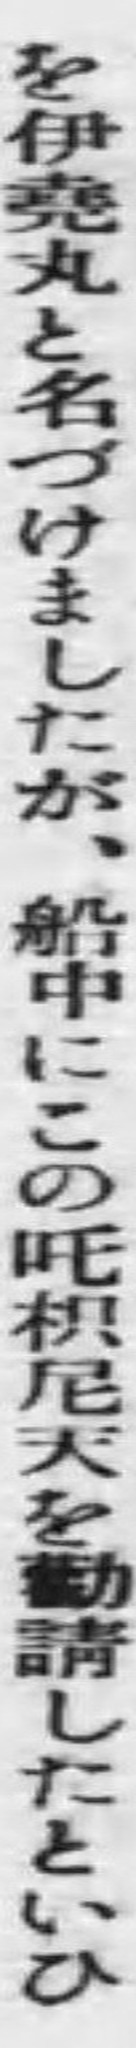を伊堯丸と名づけましたが、船中にこの吒枳尼天を勸請したといひ
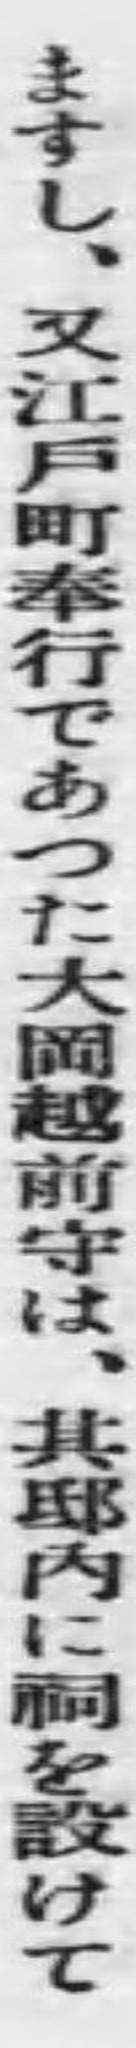ますし、又江戸町奉行であつた大岡越前守は、其邸内に祠を設けて
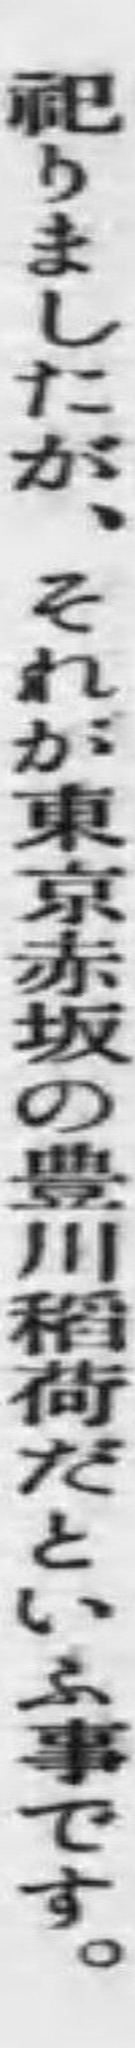祀りましたが、それが東京赤坂の豊川稻荷だといふ事です。
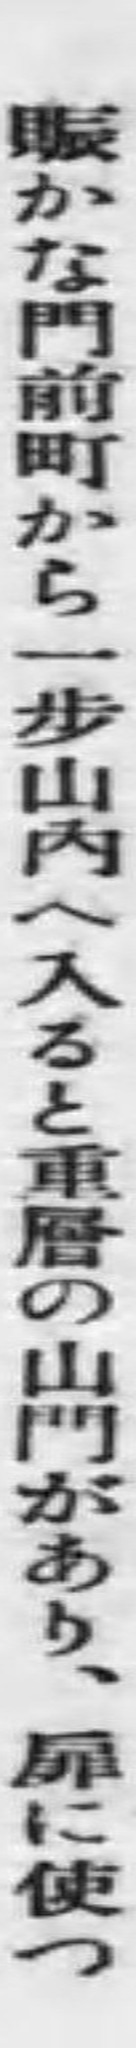賑かな門前町から一歩山内へ入ると重層の山門があり、扉に使つ
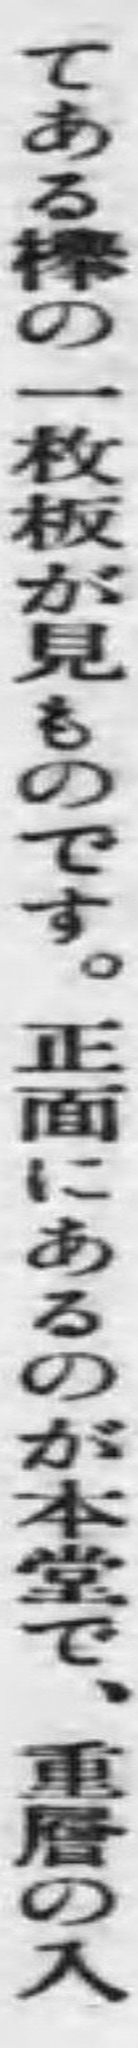てある欅の一枚板が見ものです。正面にあるのが本堂で、重層の入
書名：東三河道中記 : 豊橋市及其附近案内
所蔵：国立国会図書館 National Diet Library, JAPAN
